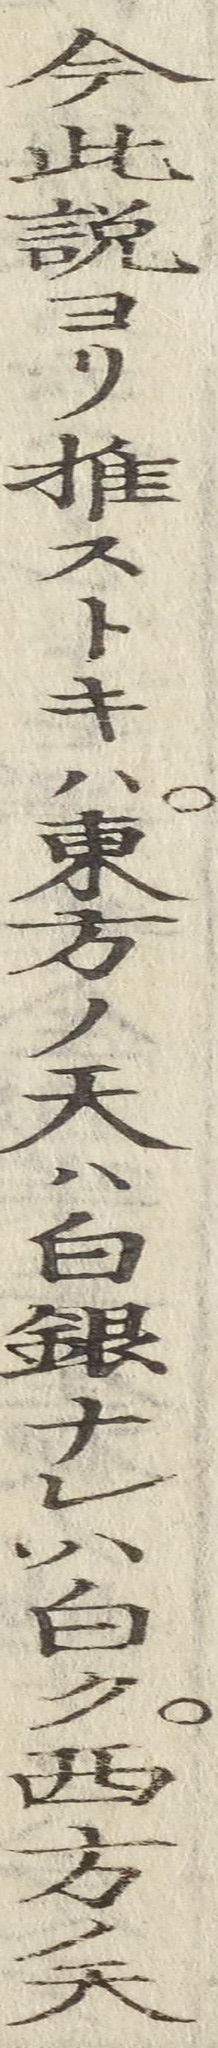今此説ヨリ推ストキハ。東方ノ天ハ白銀ナレハ白ク。西方ノ天
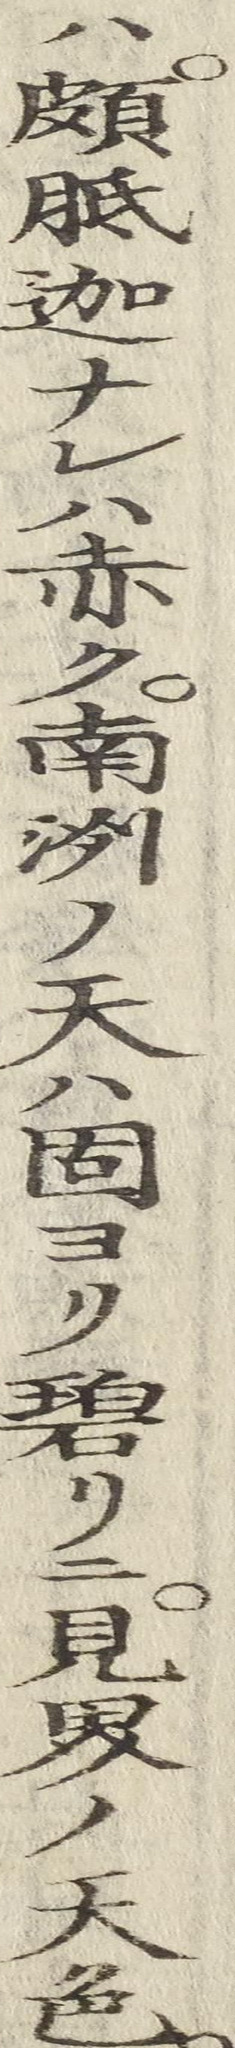ハ。頗胝迦ナレハ赤ク。南洲ノ天ハ固ヨリ碧リニ。見界ノ天色。
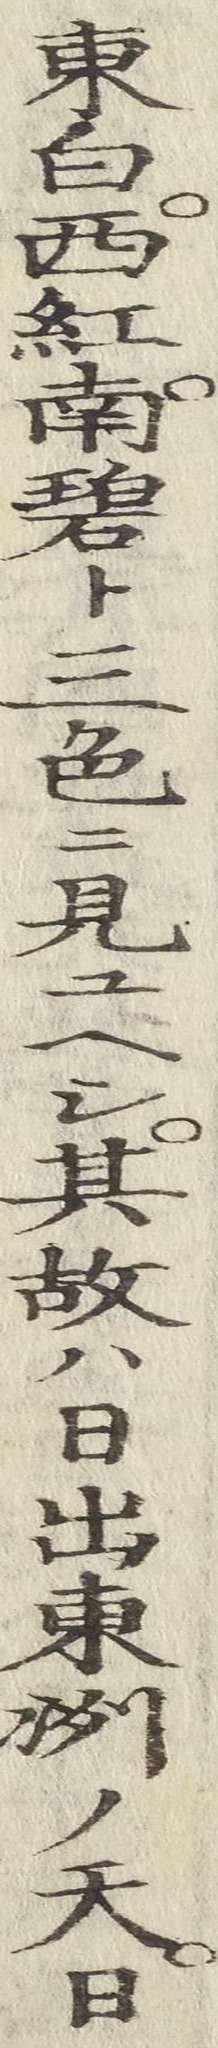東白。西紅。南碧ト三色ニ見ユヘシ。其故ハ日出東洲ノ天。日
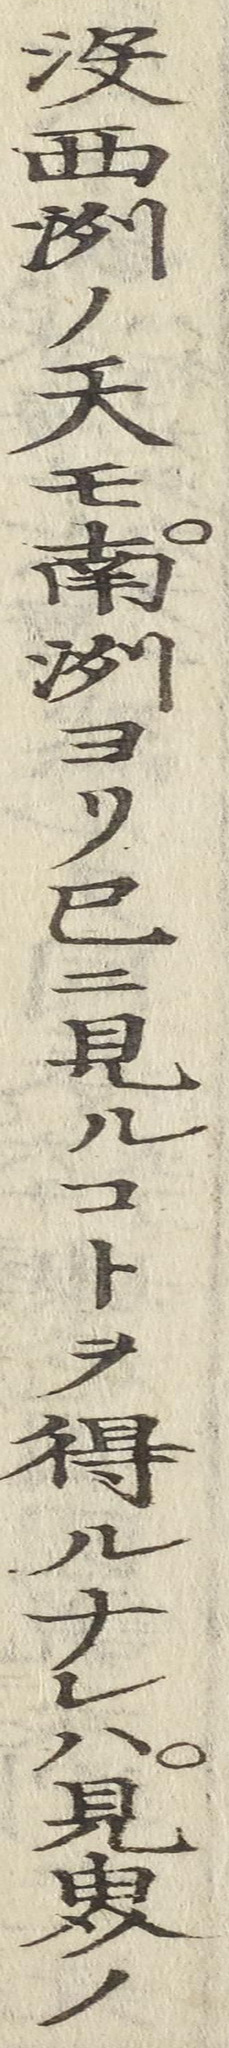没西洲ノ天モ。南洲ヨリ已ニ見ルコトヲ得ルナレハ。見界ノ
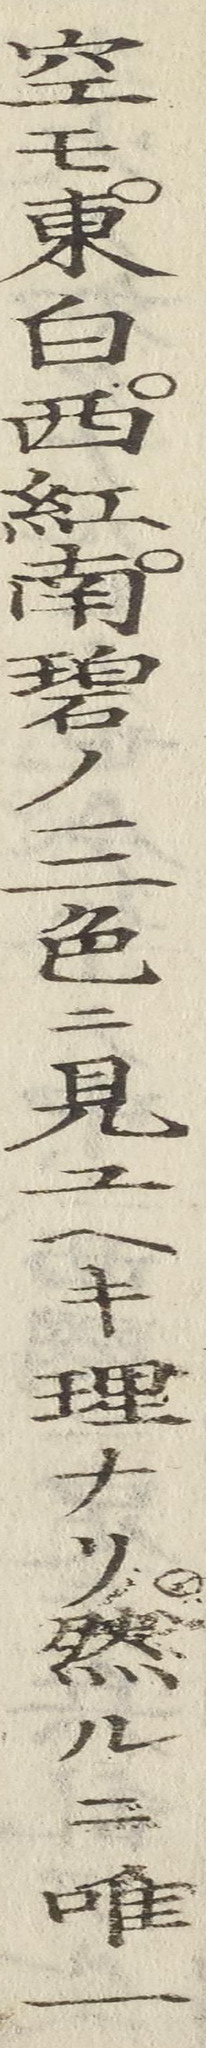空モ。東白。西紅。南碧ノ三色ニ見ユヘキ理ナリ。然ルニ唯一
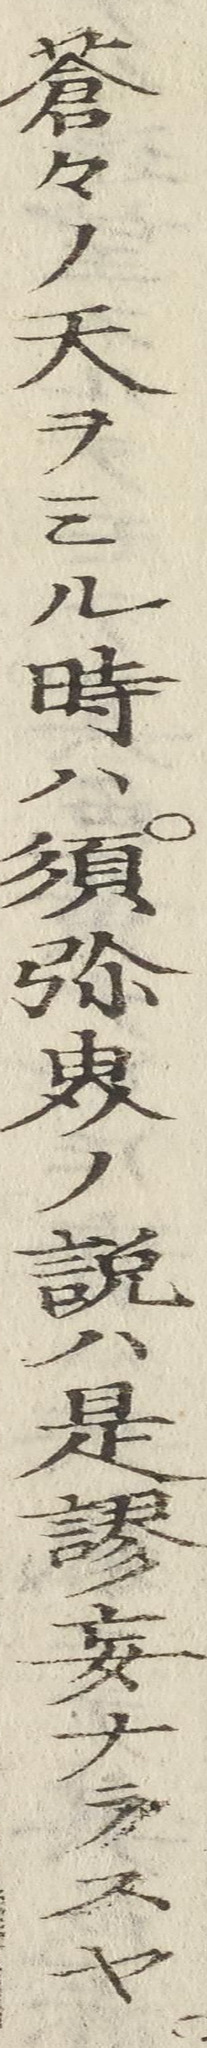蒼々ノ天ヲミル時ハ。須弥界ノ説ハ是謬妄ナラスヤ。
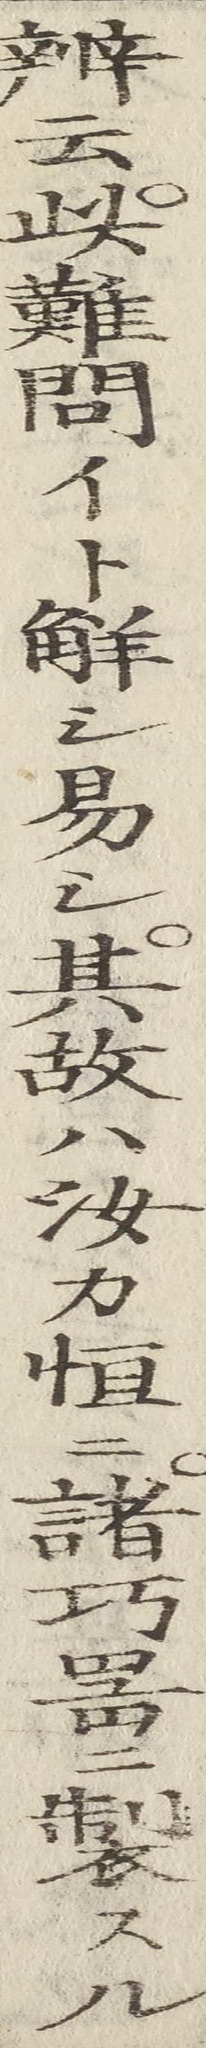弁云。此難問イト觧シ易シ。其故ハ汝カ恒ニ。諸巧器ニ製スル
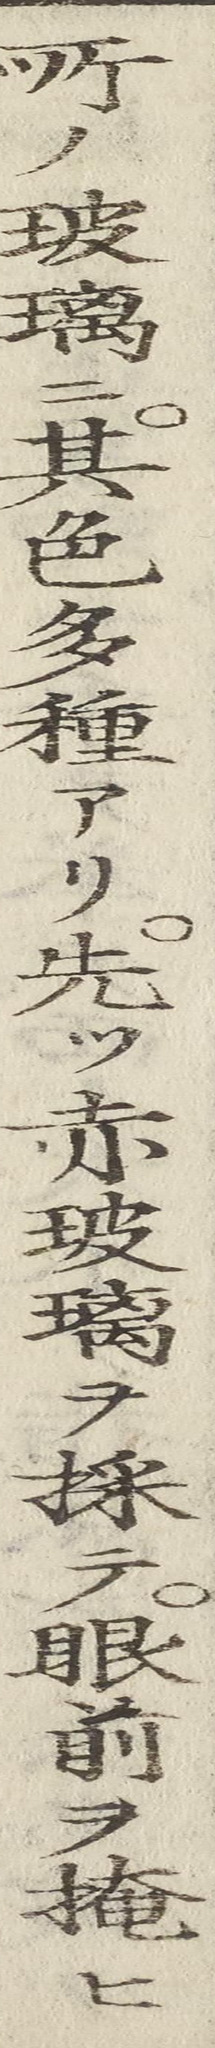所ノ玻璃ニ。其色多種アリ。先ツ赤瑠璃ヲ採テ。眼前ヲ掩ヒ
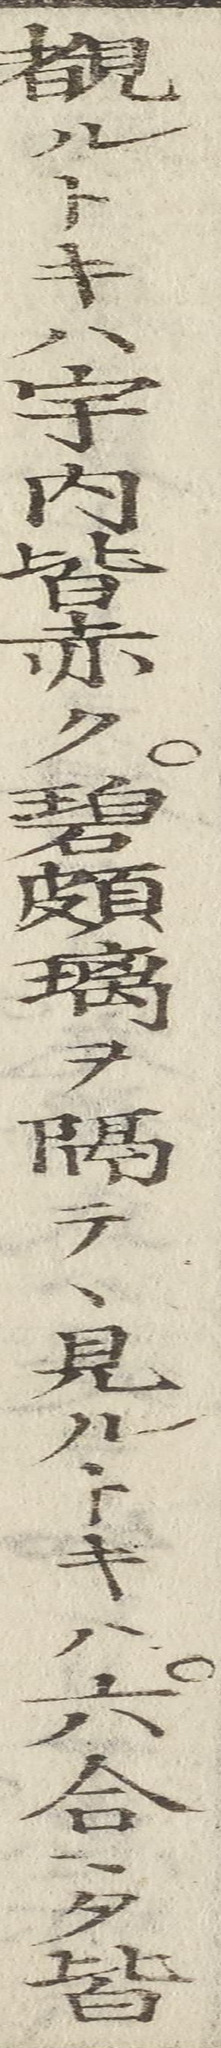覩ルトキハ宇内皆赤ク。碧頗璃ヲ隔テヽ見ルトキハ。六合マタ皆
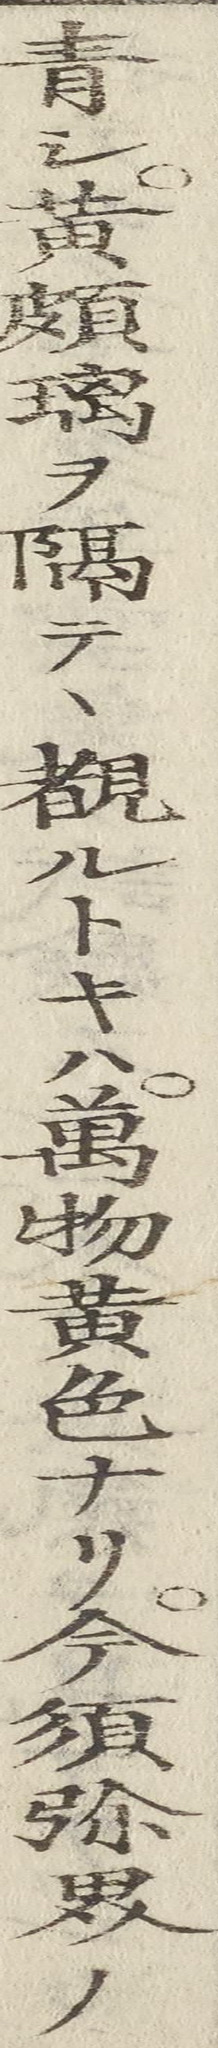青シ。黄頗璃ヲ隔テヽ覩ルトキハ。万物黄色ナリ。今須弥界ノ
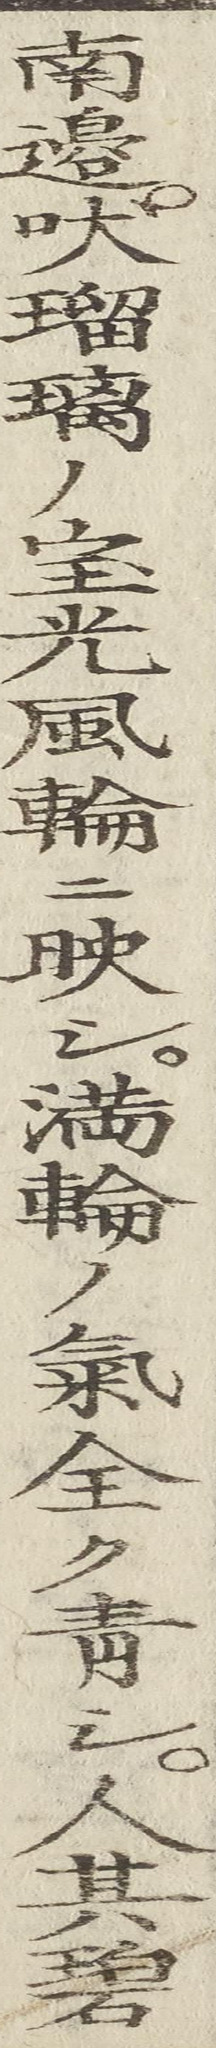南辺。吠瑠璃ノ宝光風輪ニ映シ。満輪ノ気全ク青シ。人其碧
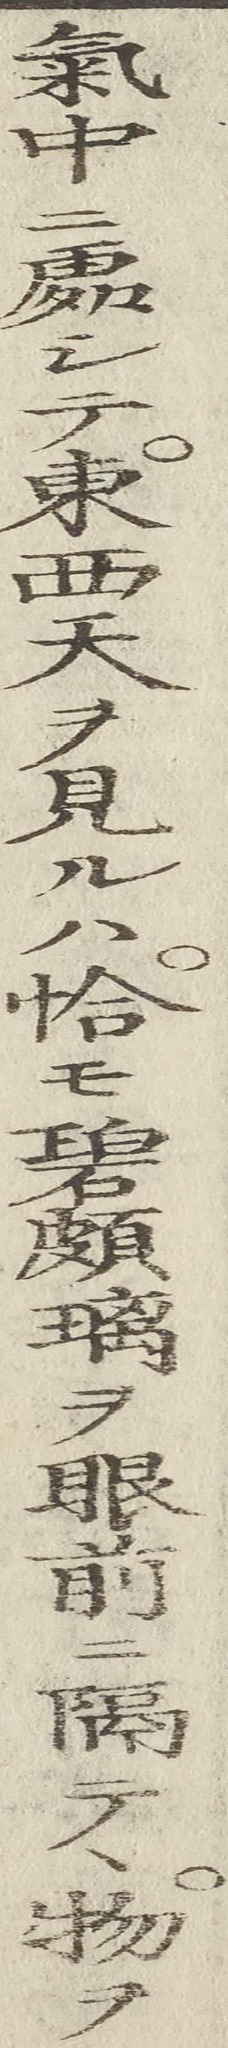気中ニ処シテ。東西天ヲ見ルハ。恰モ碧頗璃ヲ眼前ニ隔テヽ。物ヲ
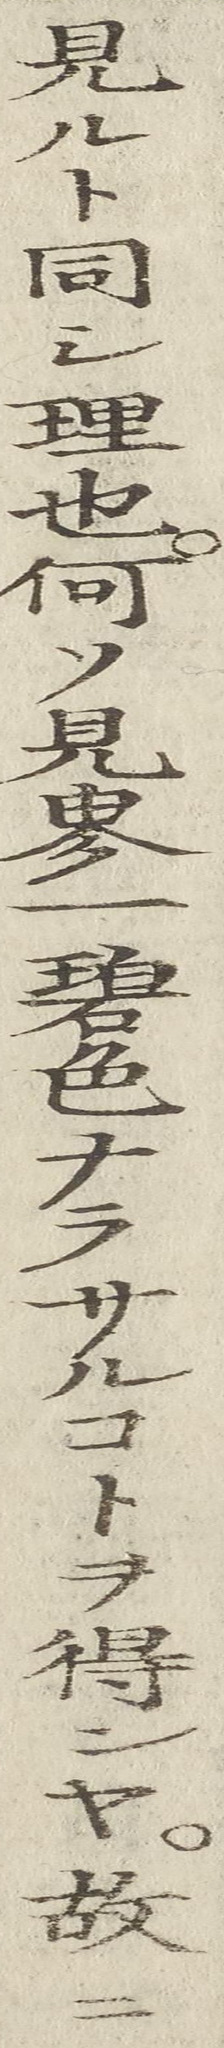見ルト同シ理也。何ソ見界一碧色ナラサルコトヲ得ンヤ。故ニ

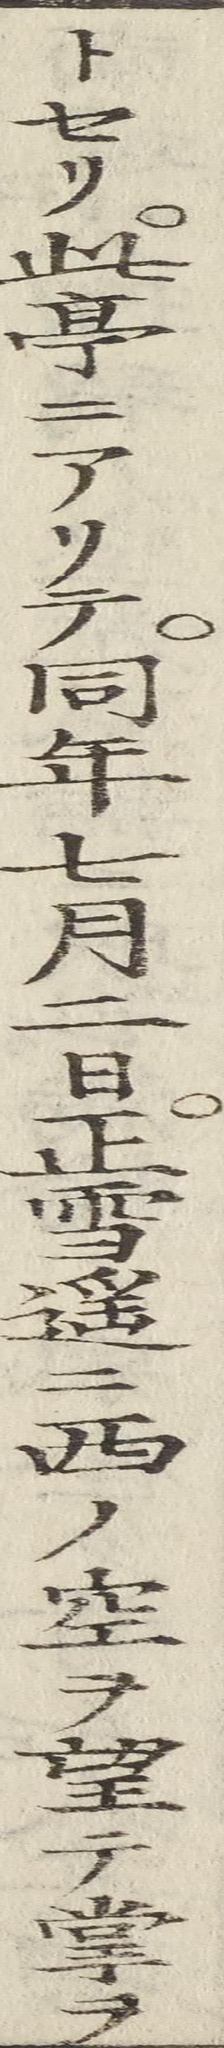トセリ。此亭ニアリテ。同年七月二日。正雪遥ニ西ノ空ヲ望テ掌ヲ
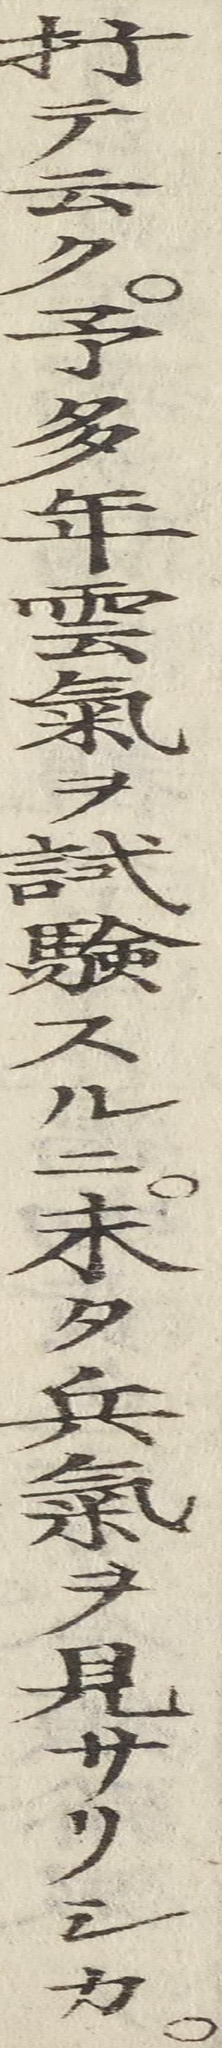打テ云ク。予多年雲気ヲ試験スルニ。未タ兵気ヲ見サリシカ。
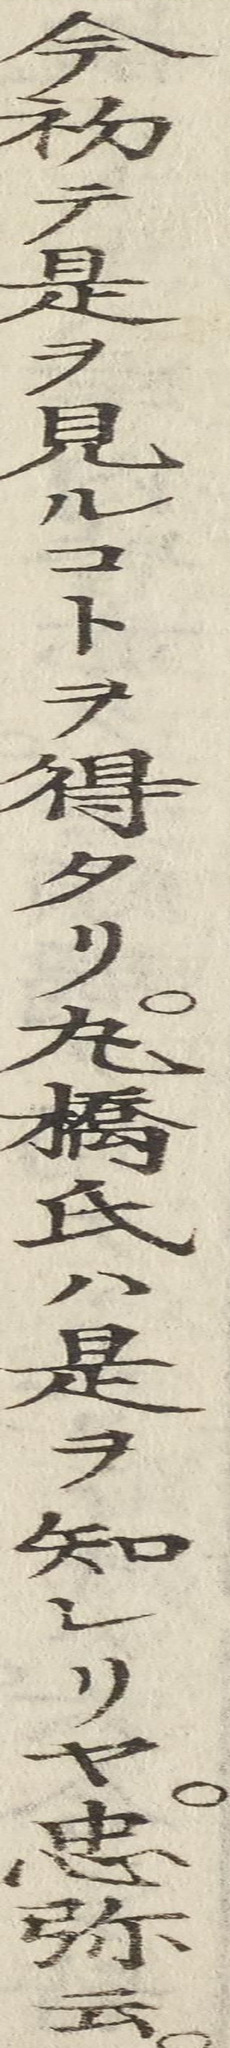今初テ是ヲ見ルコトヲ得タリ。丸橋氏ハ是ヲ知レリヤ。忠弥云。
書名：護法新論　二編　上
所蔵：東京大学地震研究所図書室 Earthquake Research Institute Library, The University of Tokyo, JAPAN
